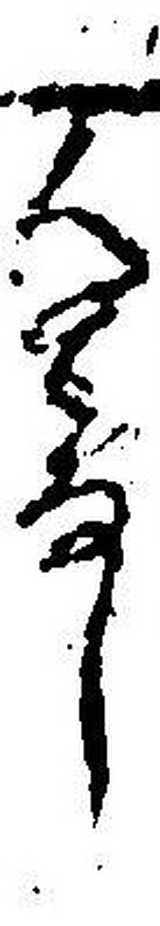人でなし
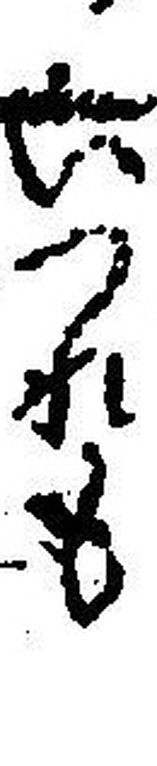いづれも
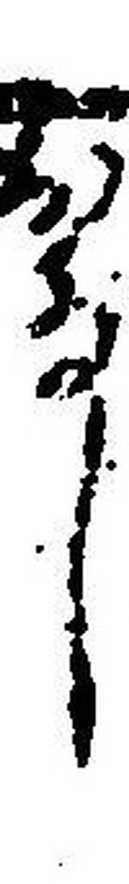おなし
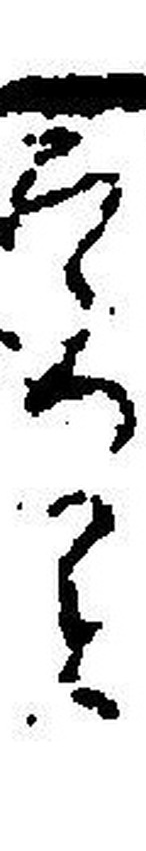こゝろかと
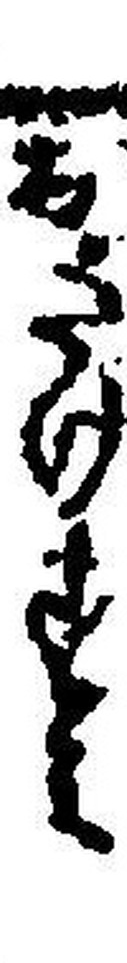おさげすみ
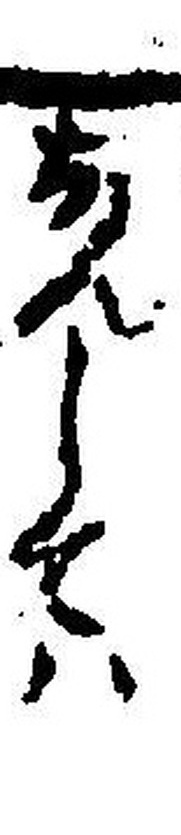なんしては
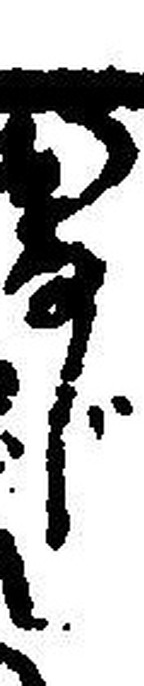おなじ
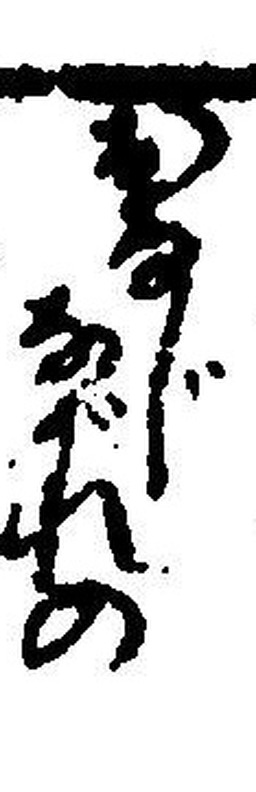ながれの
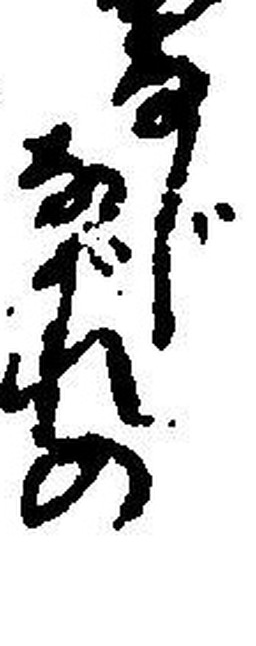ながれの
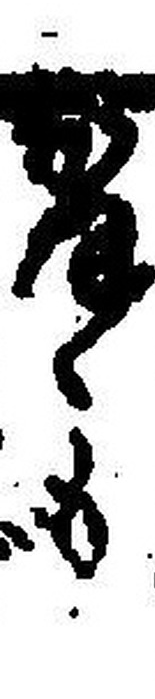かほゝも
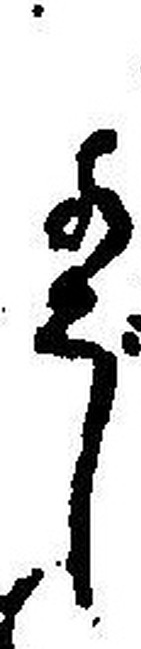よごし
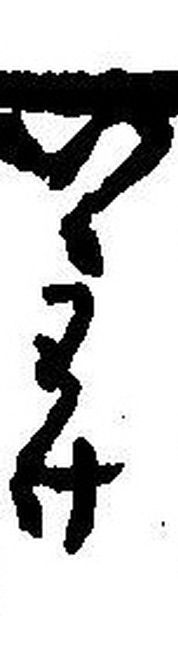いゝわけ
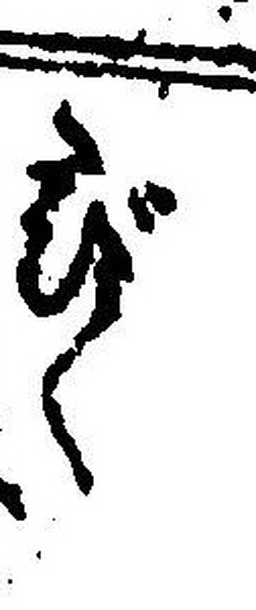たび〳〵
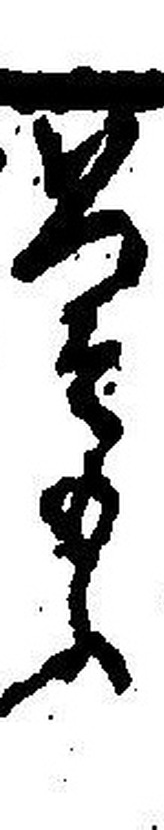いつそもふ
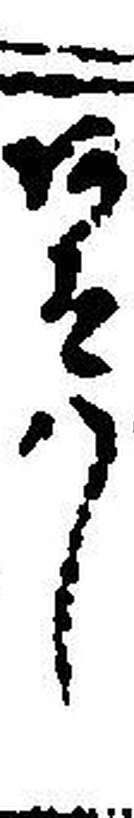あそばし
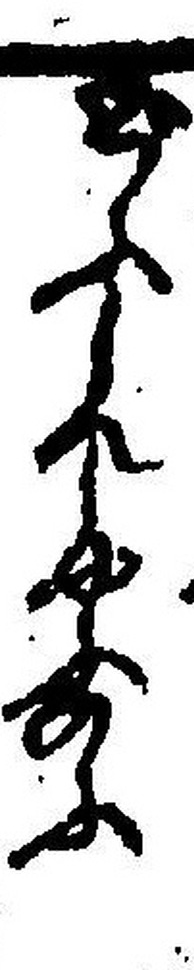どふしんしやふのふ
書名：御代参牛時詣 / 市場通笑作
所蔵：東京大学総合図書館 General Library in the University of Tokyo, JAPAN
